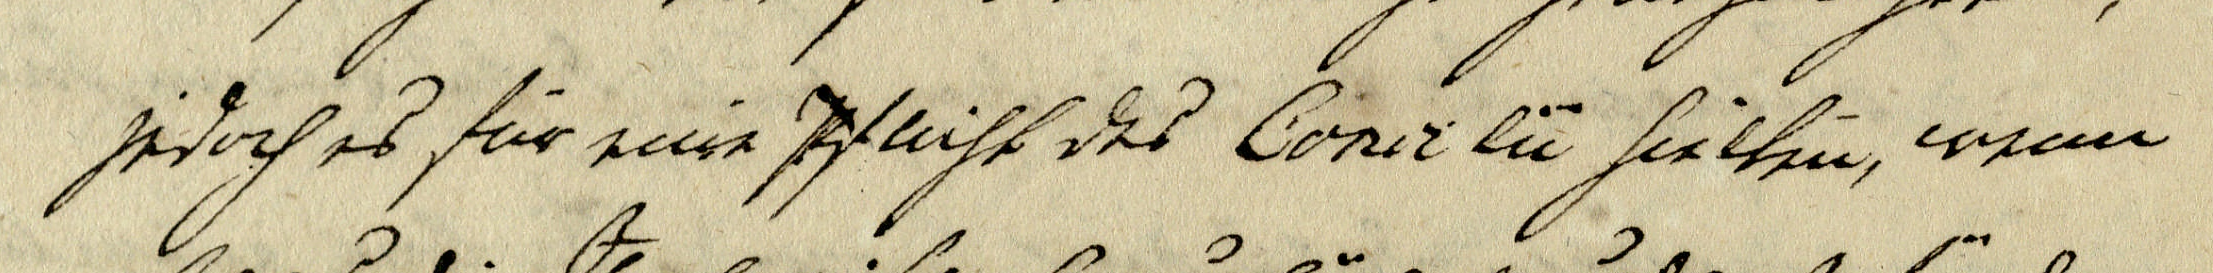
jedoch es für eine Pflicht des Concilii hielten, wenn
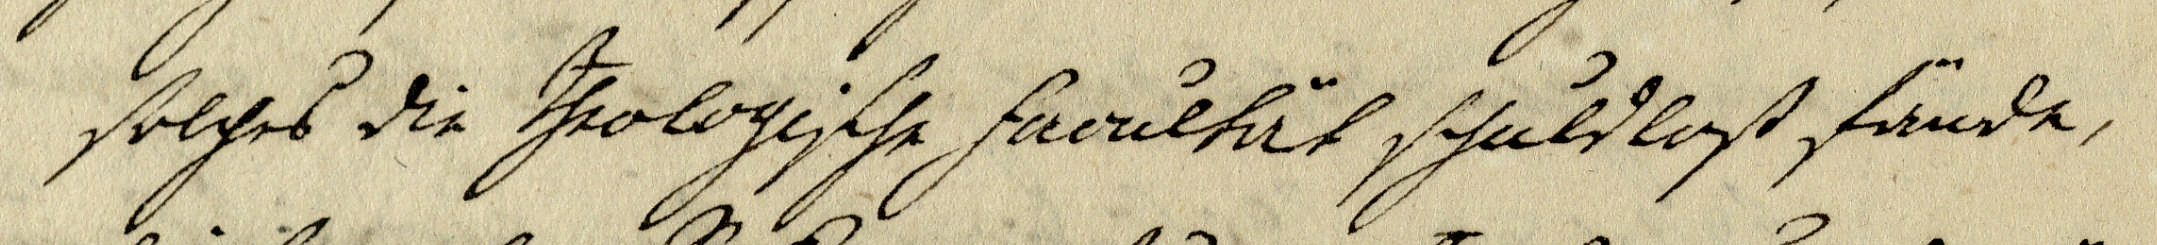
solches die Theologische Facultät schuldloß fände,
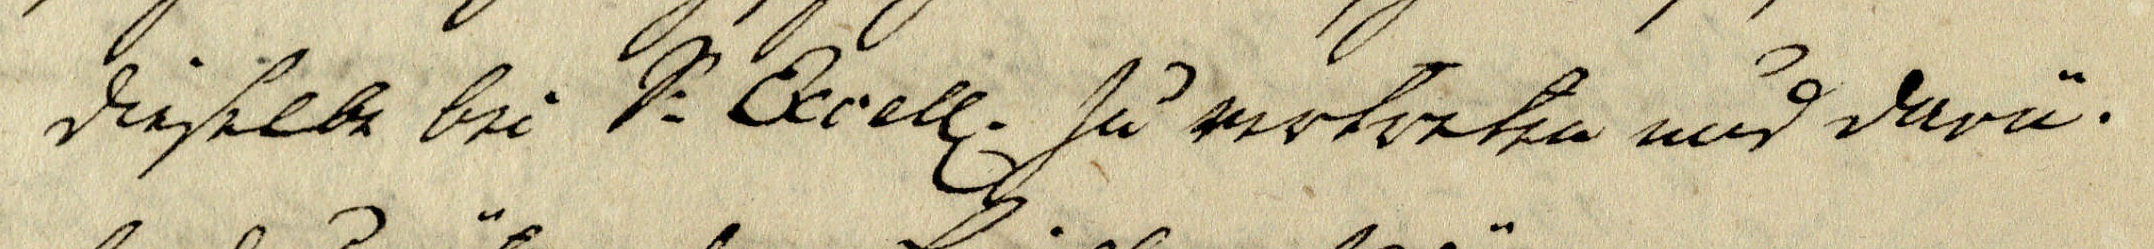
dieselbe bei Sr. Excel. zu vertreten und darü¬
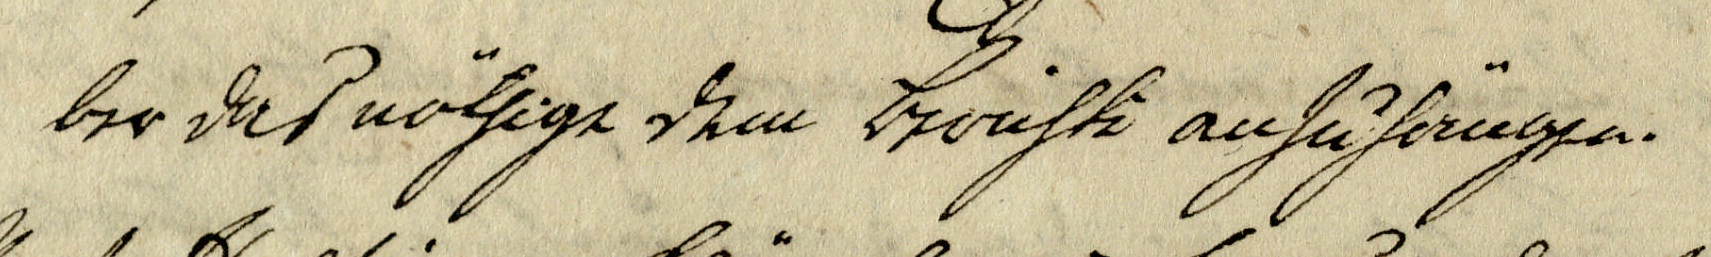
ber das nöthige dem Berichte anzuhängen.
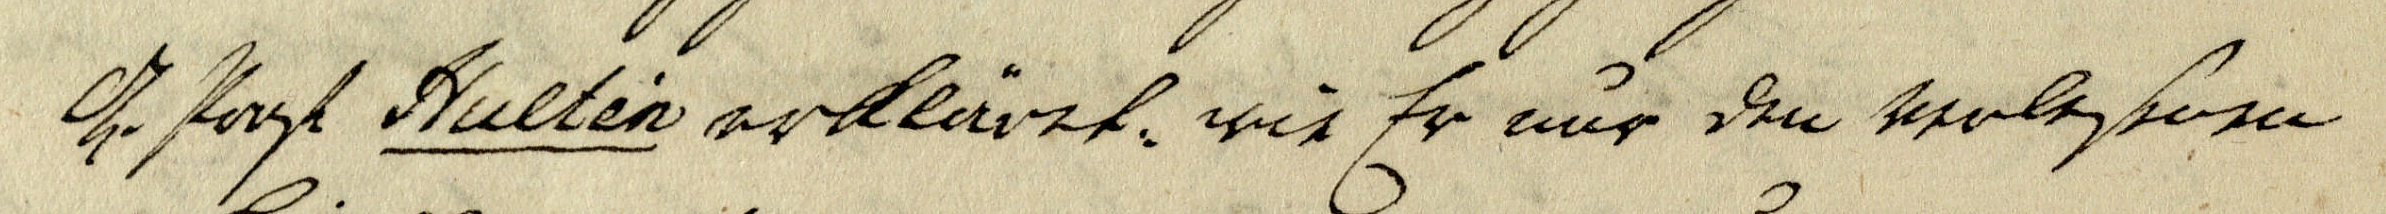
dh. Prof. Hultén erkläret: wie Er nur den verlesenen
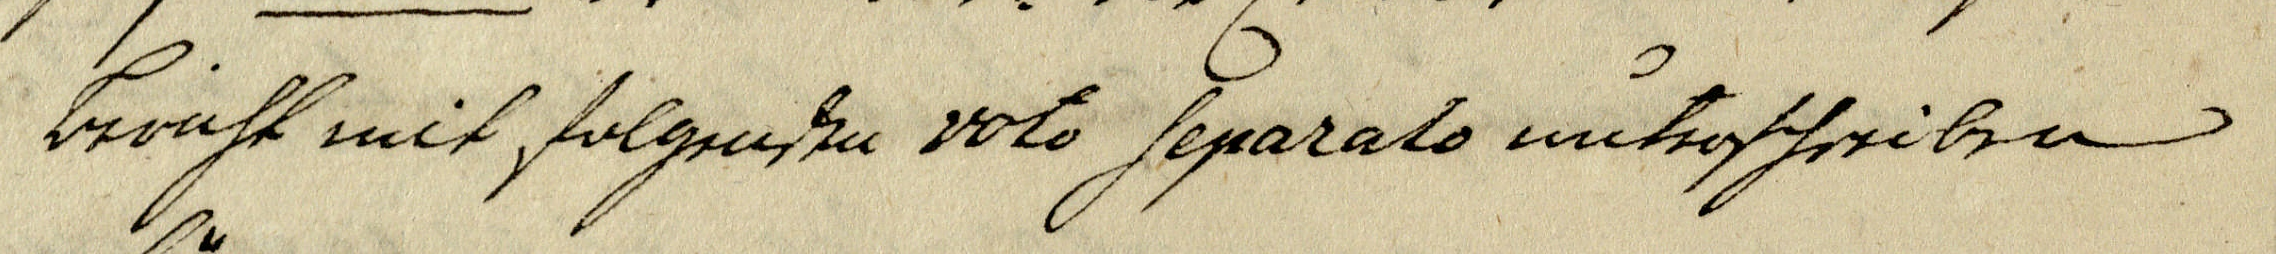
Bericht mit folgenden voto separato unterschreiben
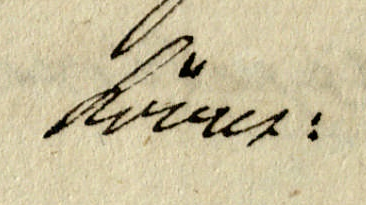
könne:
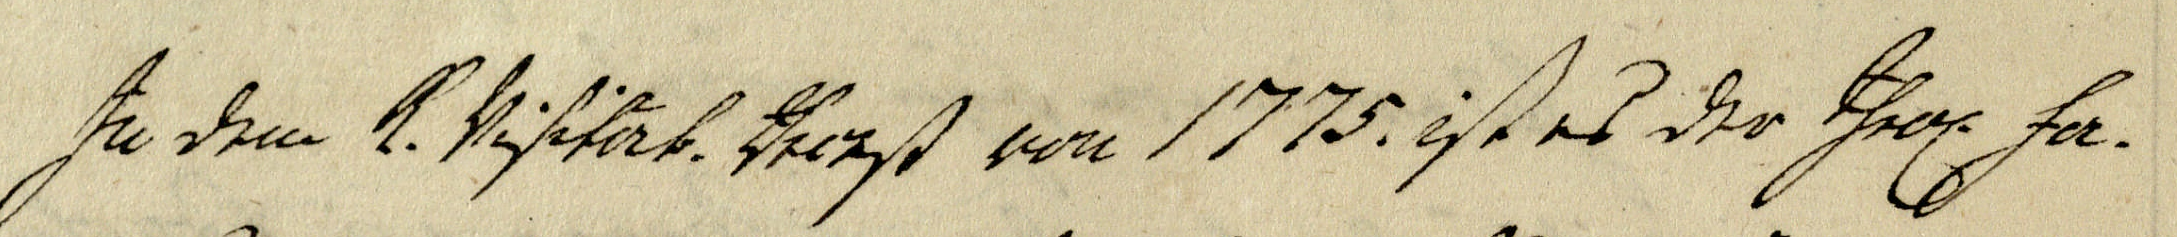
In dem K. Visitat. Receß von 1775. ist es der theol. Fa¬
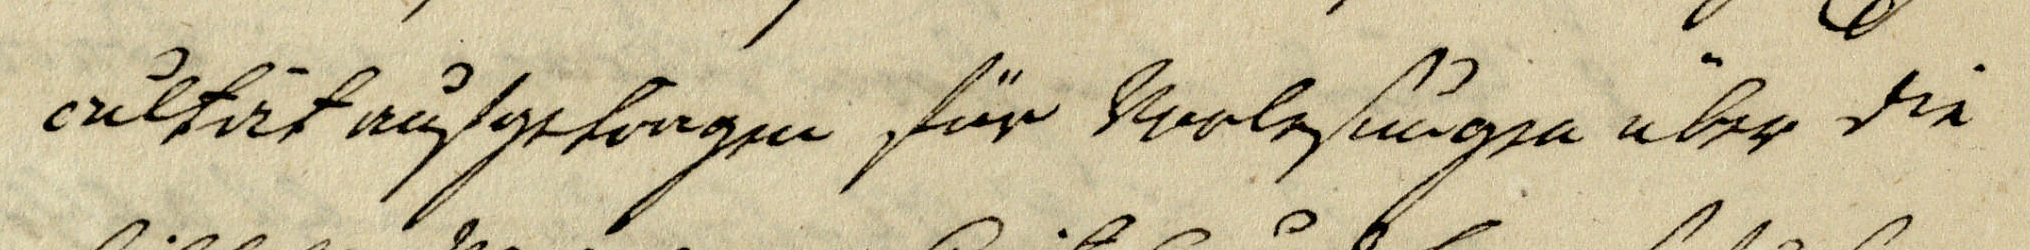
cultät aufgetragen für Vorlesungen über die
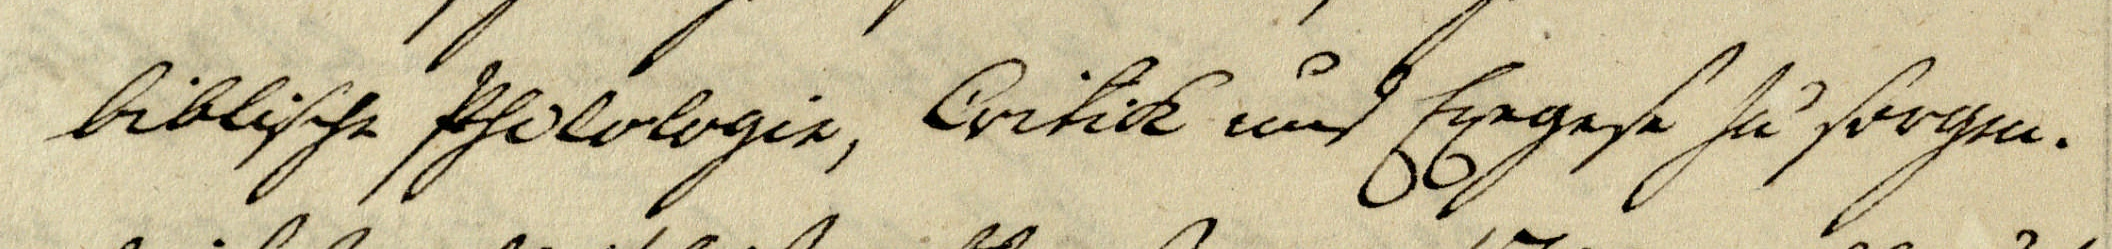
biblische Philologie, Critik und Exegese zu sorgen.
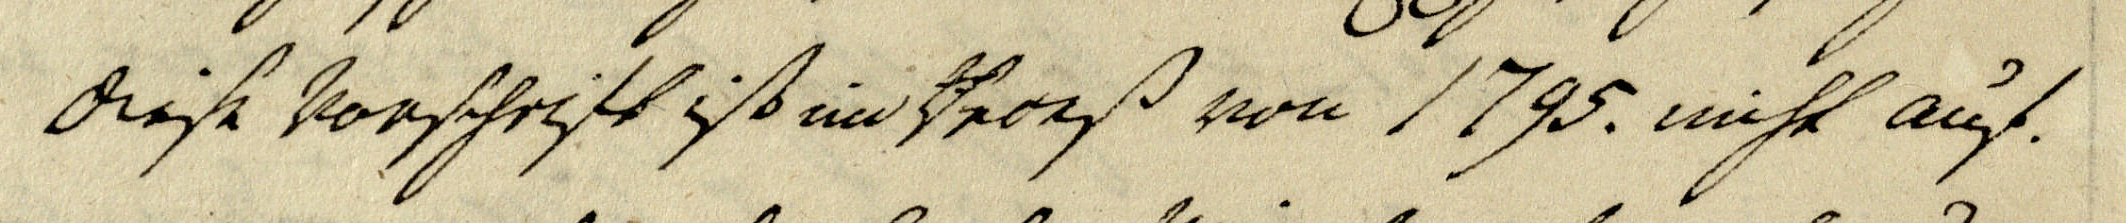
Diese Vorschrift ist im Receß von 1795. nicht auf¬
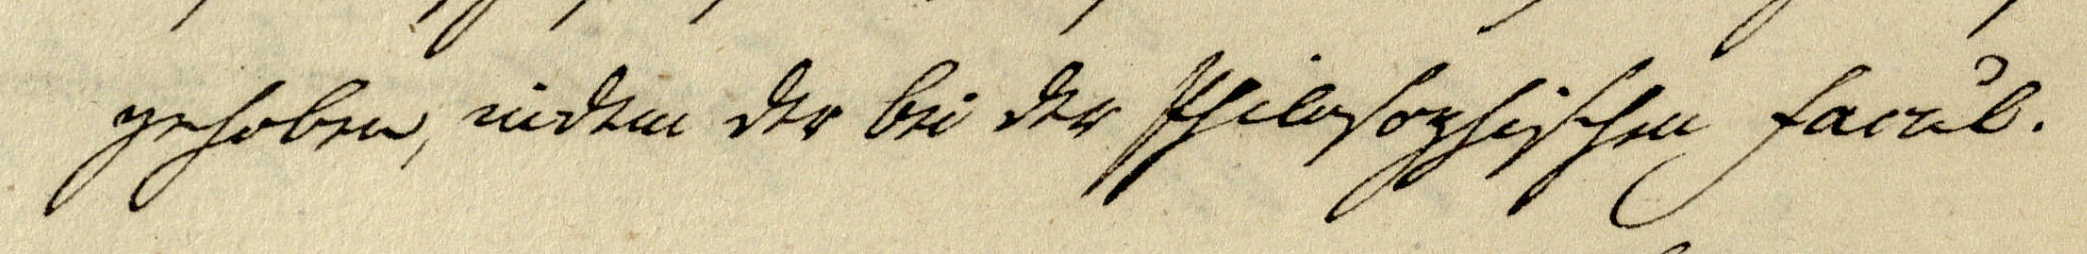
gehoben, indem der bei der Philosophischen Facul¬
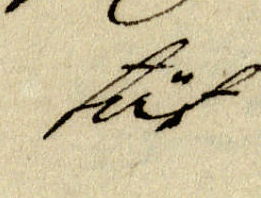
tät
